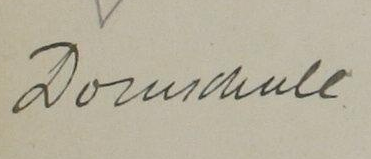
Domschule
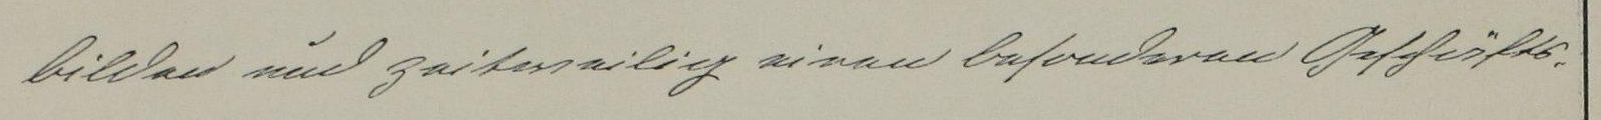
bilden und zeitweilig einen besonderen Geschäfts-
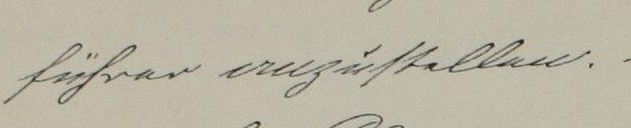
führer anzustellen
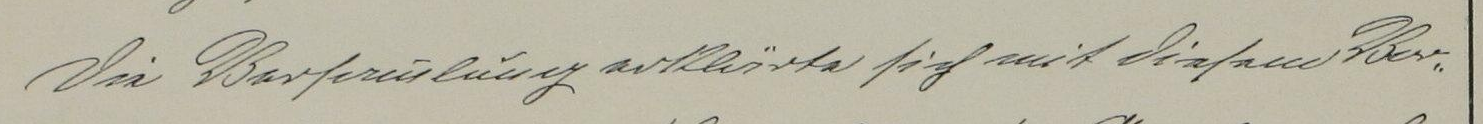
Die Versammlung erklärte sich mit diesem Vor-
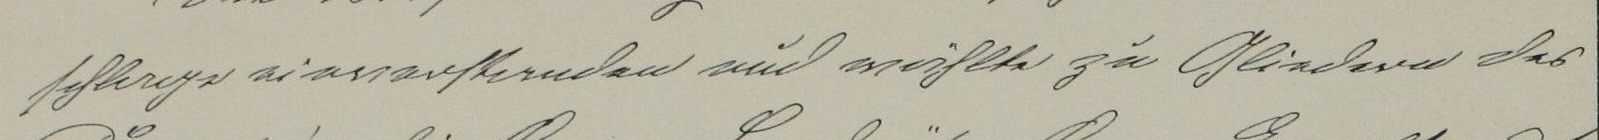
schlage einverstanden und wählte zu Gliedern des
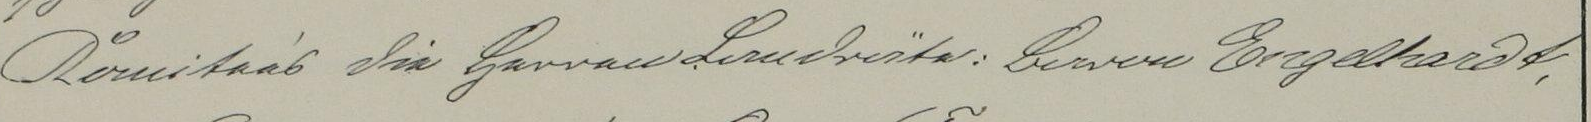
Komiteés die Herren Landräte: Baron Engelhardt,
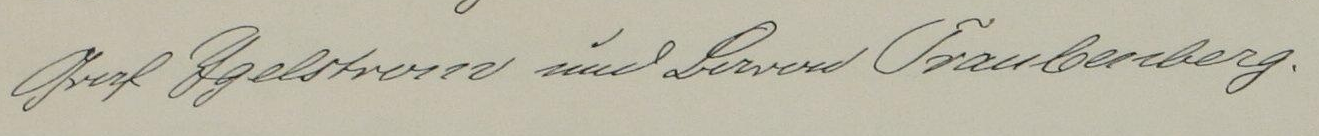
Graf Igelstrom und Baron Traubenberg.
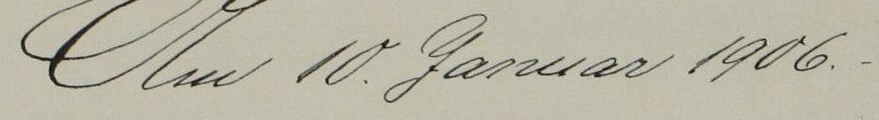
Am 10. Januar 1906
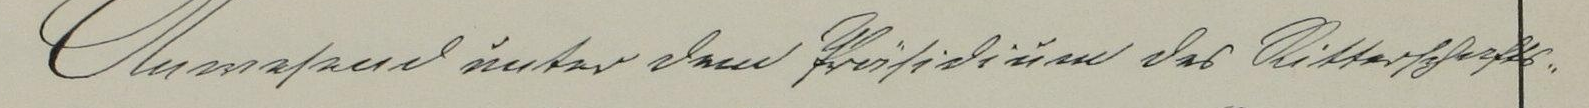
Anwesend unter dem Präsidium des Ritterschafts-
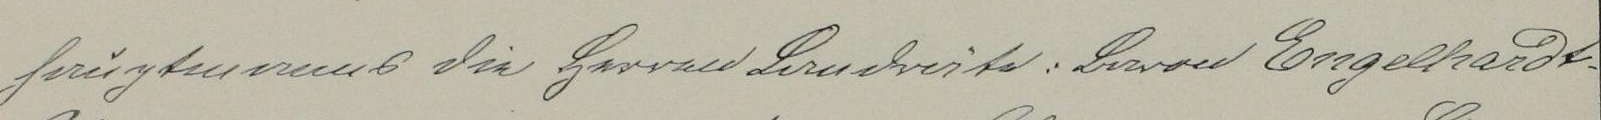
hauptmanns die Herren Landräte: Baron Engelhardt-
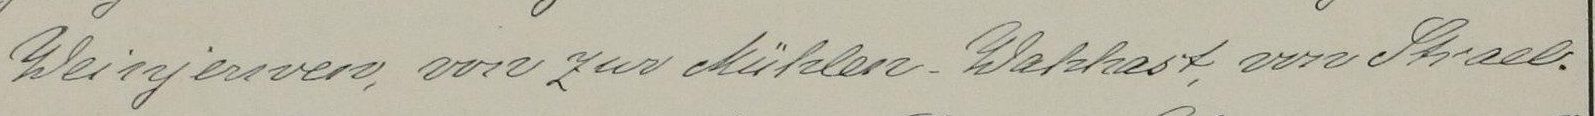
Weinjerwen, von zur Mühlen-Wahhast, von Strael-
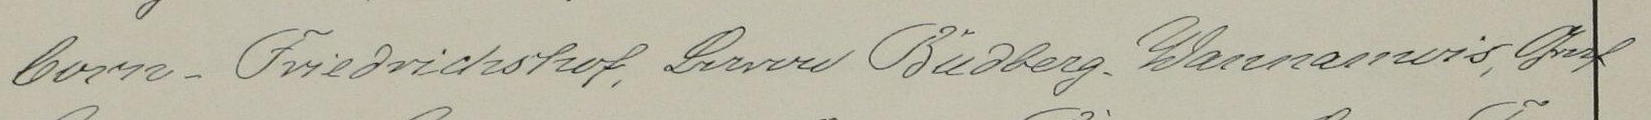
born-Friedrichshof, Baron Budberg-Wannamois, Graf
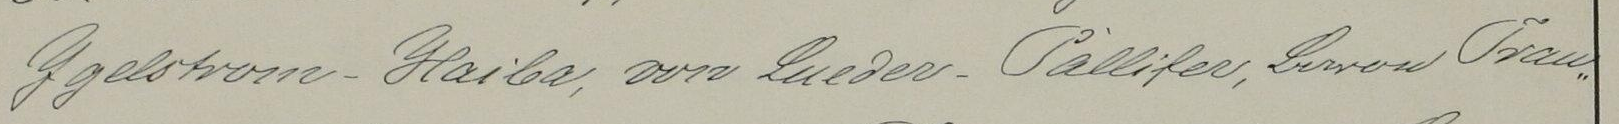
Igelstrom-Haiba, von Lueder-Pallifer, Baron Trau-
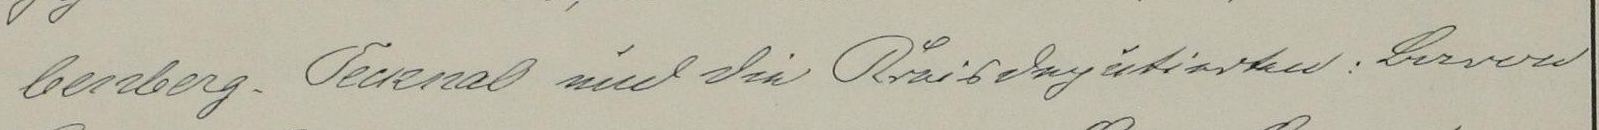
benberg-Tecknal und die Kreisdeputierten: Baron
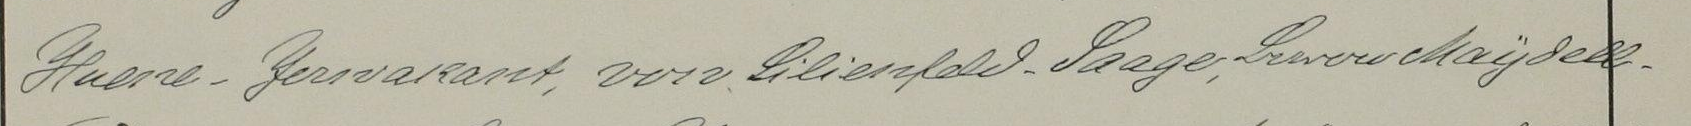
Huene-Jerwakant, von Lilienfeld-Saage, Baron Maydell-
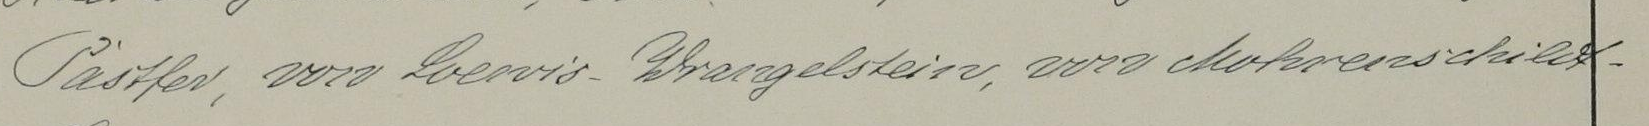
Pastfer, von Loewis-Wrangelstein, von Mohrenschildt-
